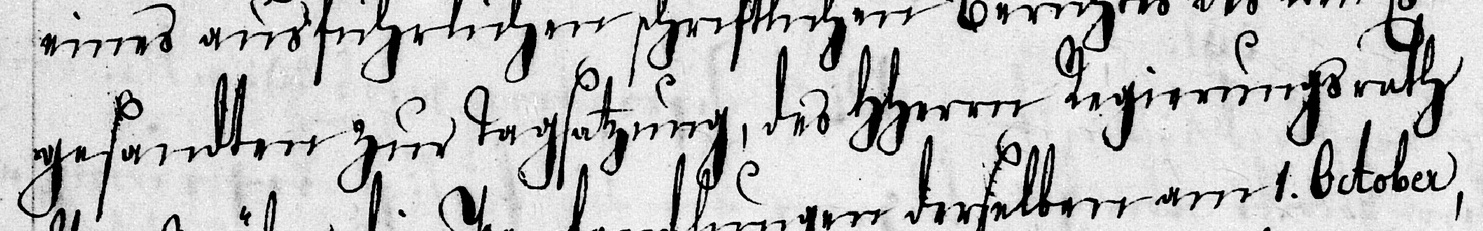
gesandten zur Tagsatzung, des HHerrn Regierungsrath
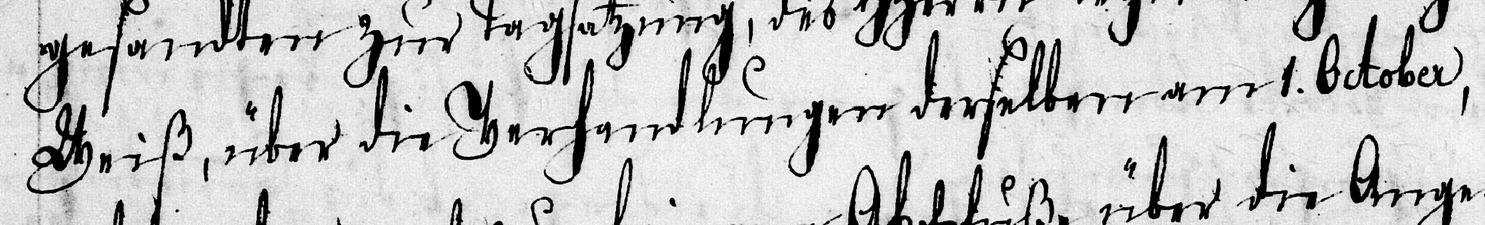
Weiß, über die Verhandlungen derselben am 1. October,
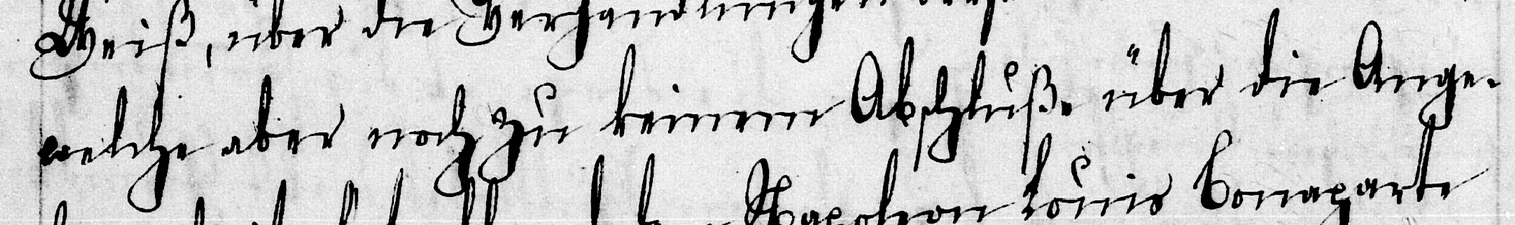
welche aber noch zu keinem Abschluße über die Ange¬
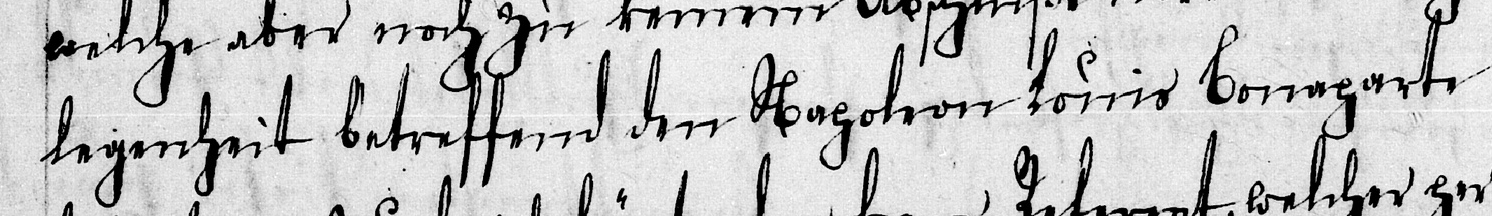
legenheit betreffend den Napoleon Louis Bonaparte
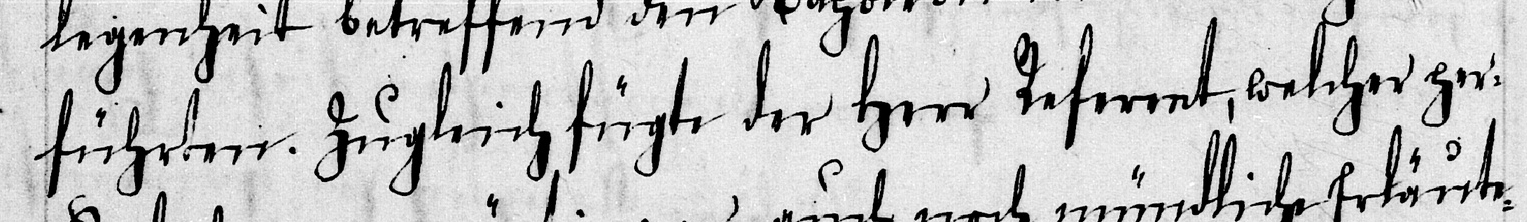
führten. Zugleich fügte der Herr Referent, welcher per¬
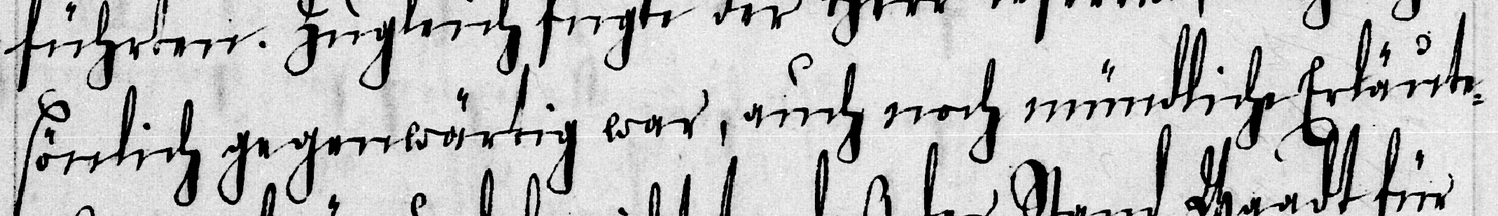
sönlich gegenwärtig war, auch noch mündliche Erläute¬
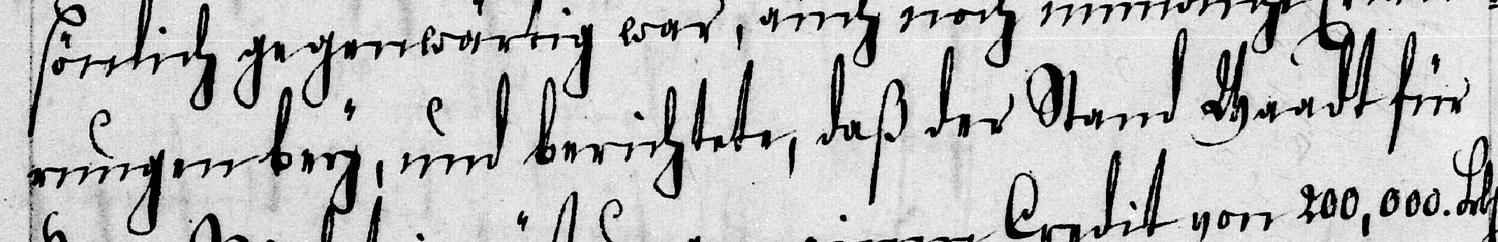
rungen bey, und berichtete, daß der Stand Waadt für
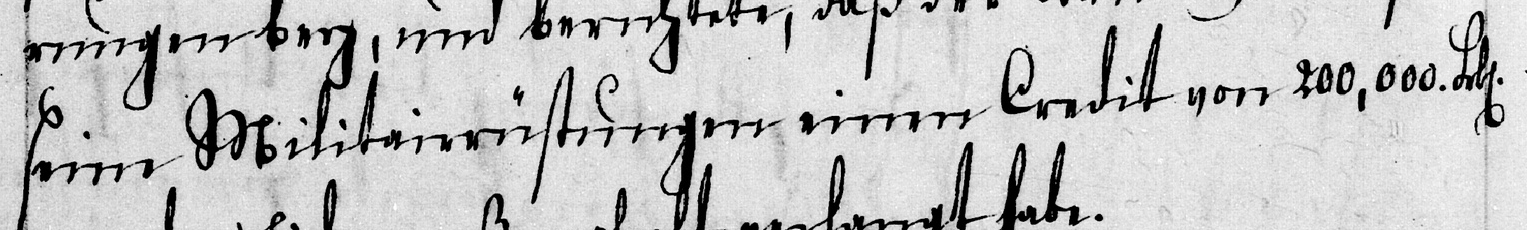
seine Militairrüstungen einen Credit von 200'000 Fr¬
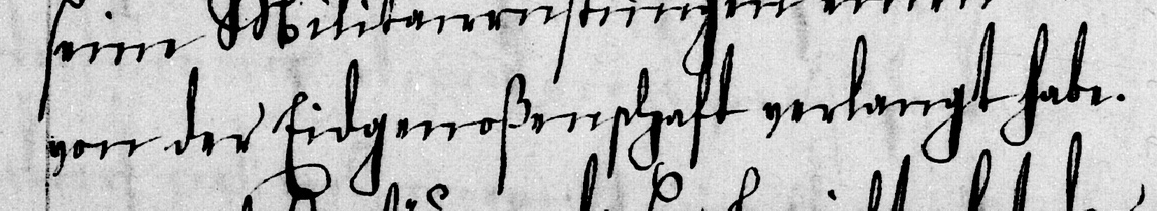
von der Eidgenoßenschaft verlangt habe.
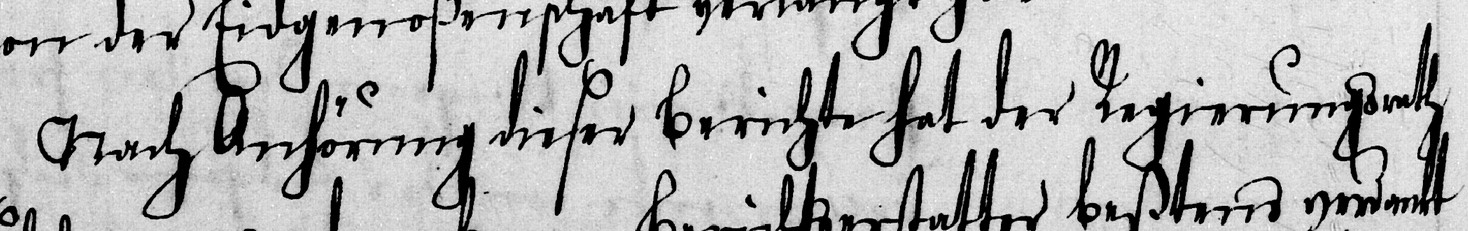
Nach Anhörung dieser Berichte hat der Regierungsrath
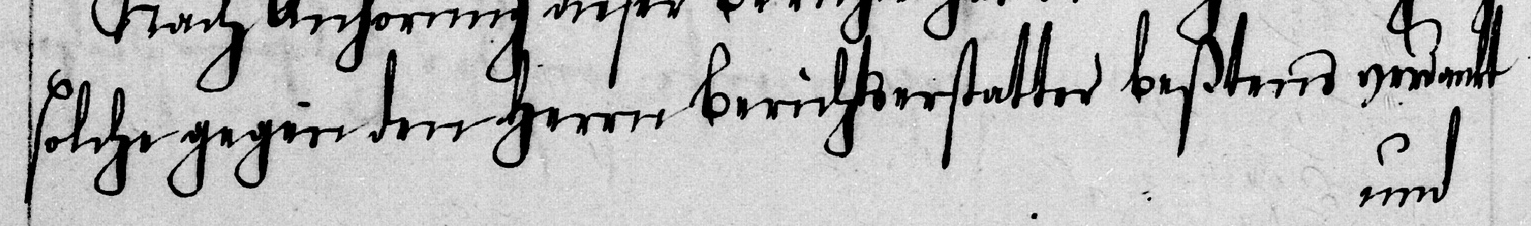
solche gegen den Herrn Berichtserstatter beßtens verdankt
